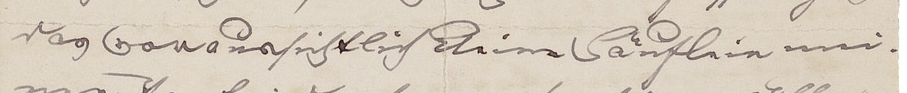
das voraussichtlich kleine Häuflein mei-
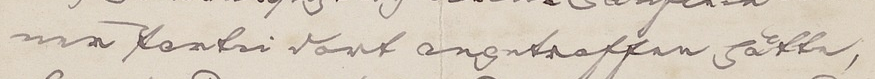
ner Partei dort angetroffen hätte,
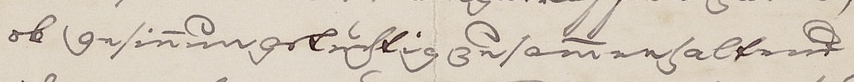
ob gesinnungstüchtig zusammenhaltend
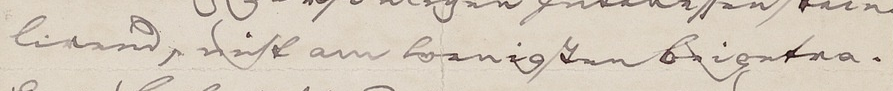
lirend, nicht am wenigsten beigetra-
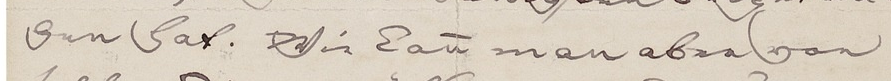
gen hat. Wie kann man aber von
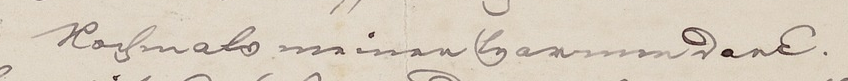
Nochmals meinen warmen Dank.
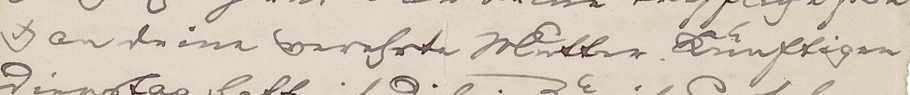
& an Deine verehrte Mutter. Künftigen
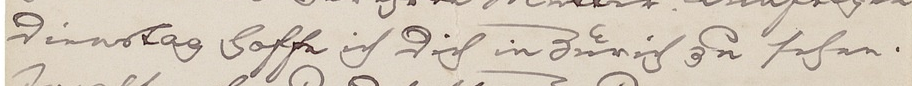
Dienstag hoffe ich Dich in Zürich zu sehen.
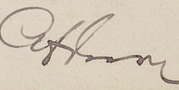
Dein
